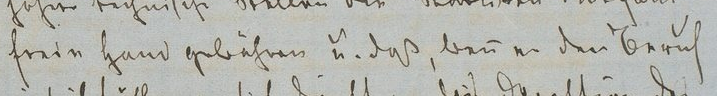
freie Hand gewähren u. daß, wenn er den Beruf
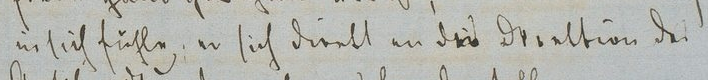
in sich fühle, er sich direkt an die Direktion des
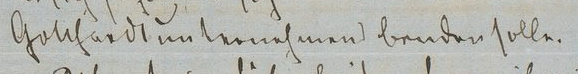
Gotthardtunternehmens wenden solle.
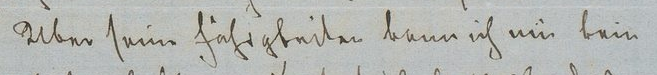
Über seine Fähigkeiten kann ich mir kein
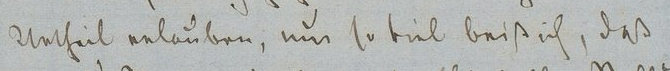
Urtheil erlauben, nur so viel weiß ich, daß
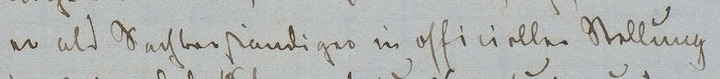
er als Sachverständiger in officieller Stellung
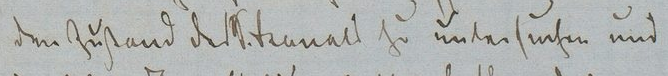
den Zustand des S. Tunnels zu untersuchen und
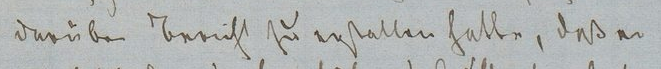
darüber Bericht zu erstatten hatte, daß er
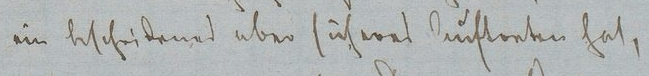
ein bescheidenes aber sicheres Auftreten hat,
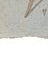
ein
